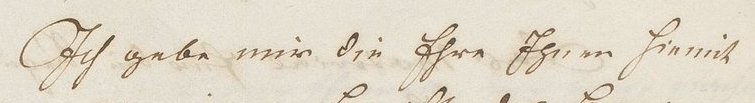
Ich gebe mir die Ehre Ihnen hiemit
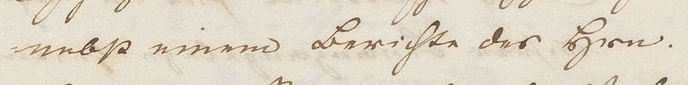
nebst einem Berichte des Hrn.
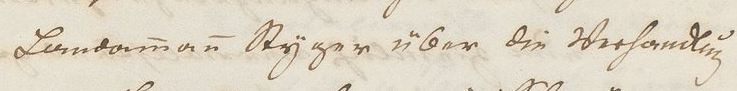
Landammann Styger über die Verhandlung
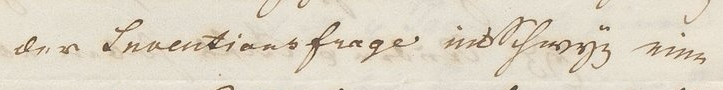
der Suventionsfrage in Schwyz eine
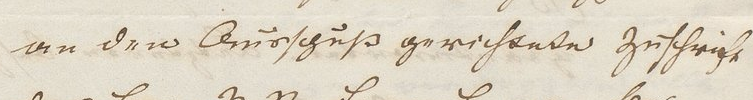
an den Ausschuß gerichtete Zuschrift
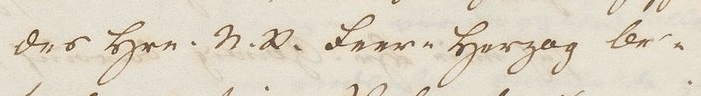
des Hrn. N.R. Feer-Herzog be-
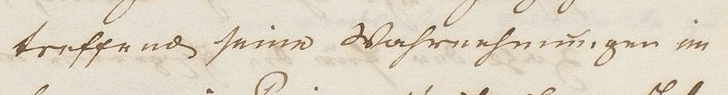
treffend seine Wahrnehmungen im
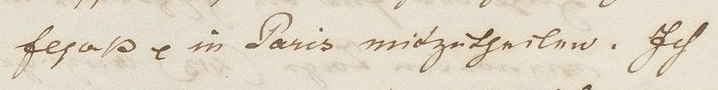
Elsaß & in Paris mitzutheilen. Ich
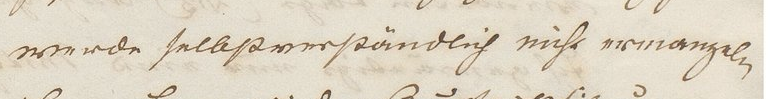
werde selbstverständlich nicht ermangeln
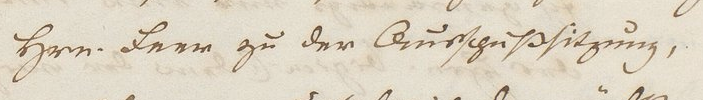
Hrn. Feer zu der Ausschußsitzung,
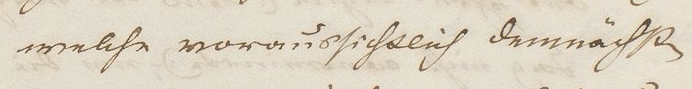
welche voraussichtlich demnächst
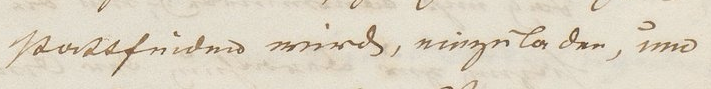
stattfinden wird, einzuladen, um
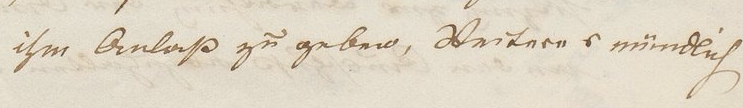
ihm Anlaß zu geben, Weiteres mündlich
